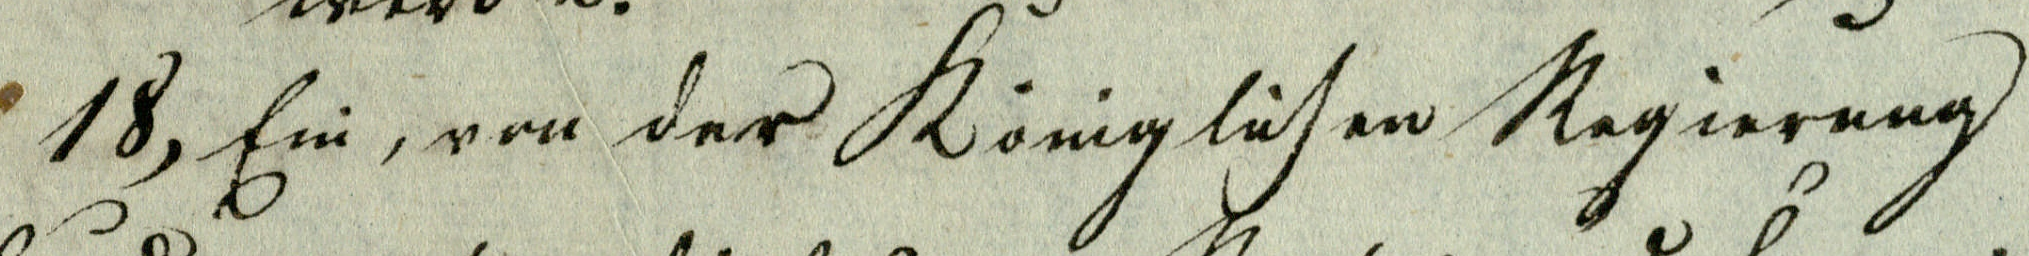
18, Ein, von der Königlichen Regierung
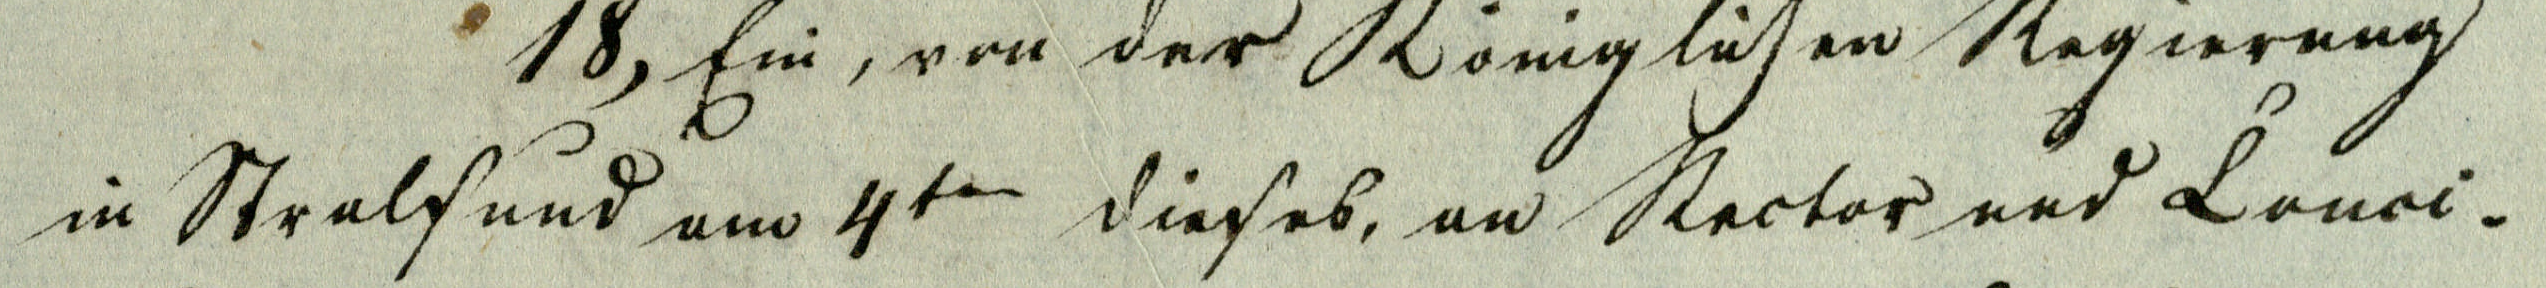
in Stralsund am 4ten dieses, an Rector und Conci¬
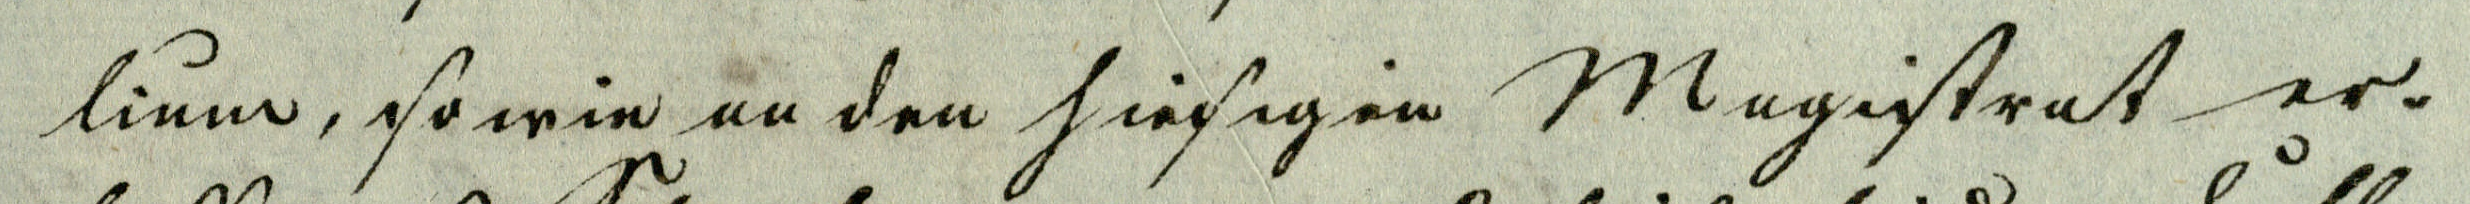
lium, so wie an den hiesigen Magistrat er¬
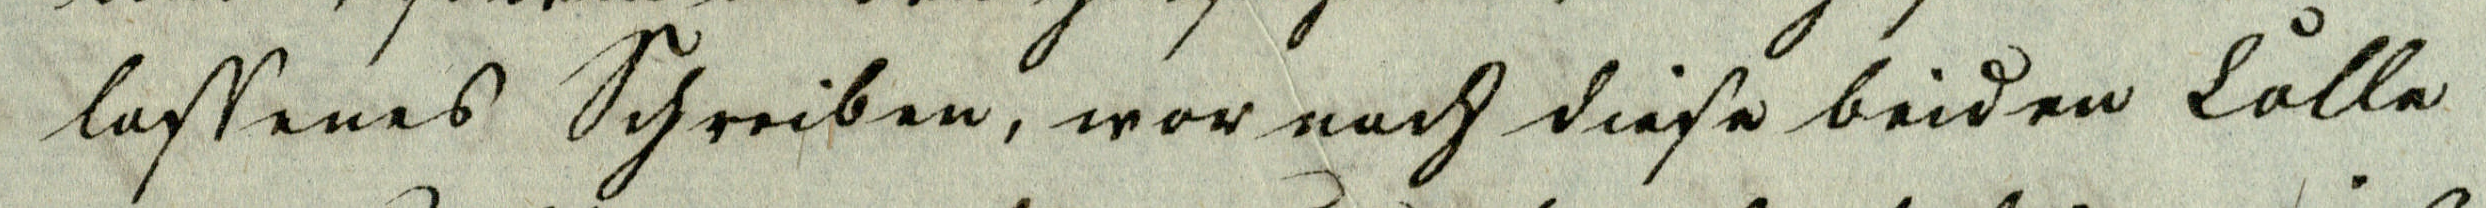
lassenes Schreiben, wornach diese beiden Colle
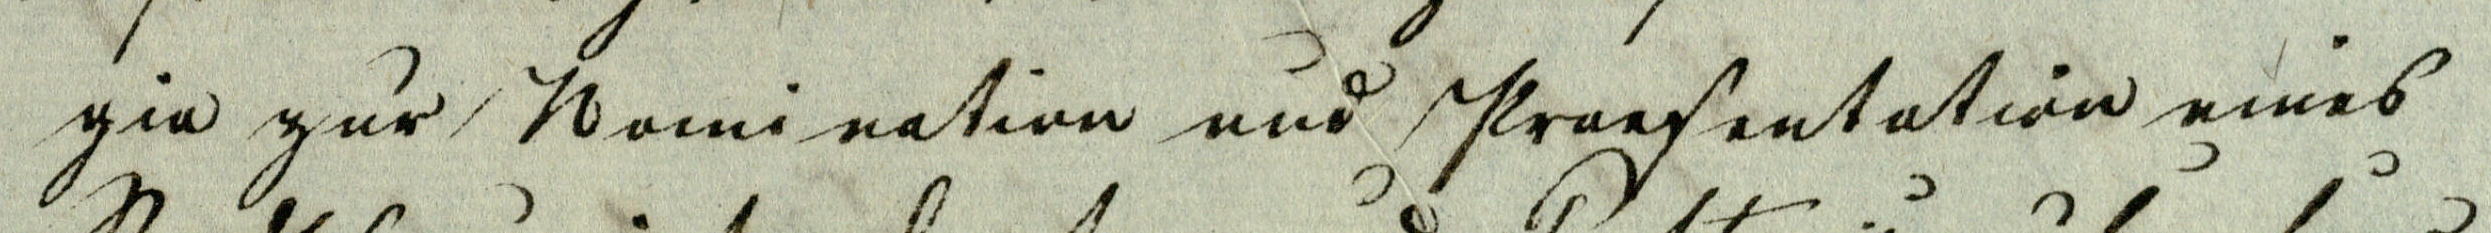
gia zur Nomination und Praesentation eines
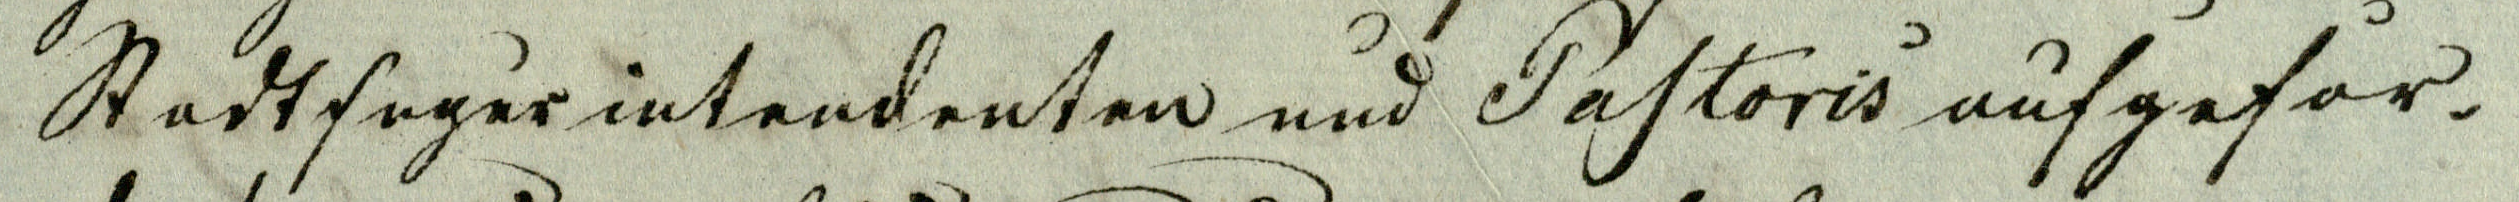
Stadtsuperintendenten und Pastoris aufgefor¬
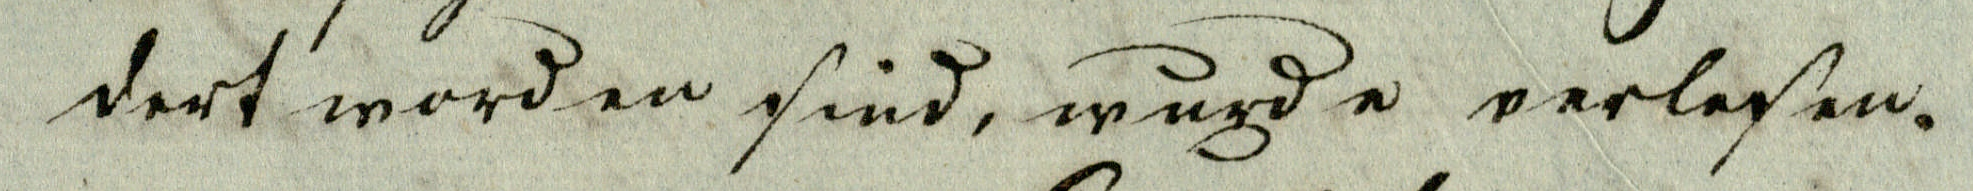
dert worden sind, wurde verlesen.
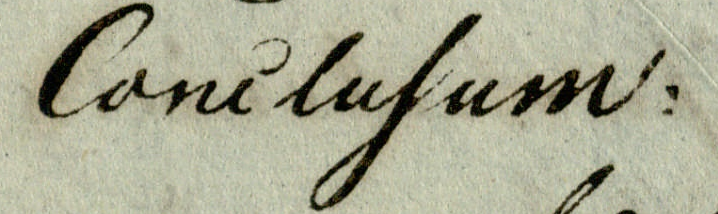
Conclusum:
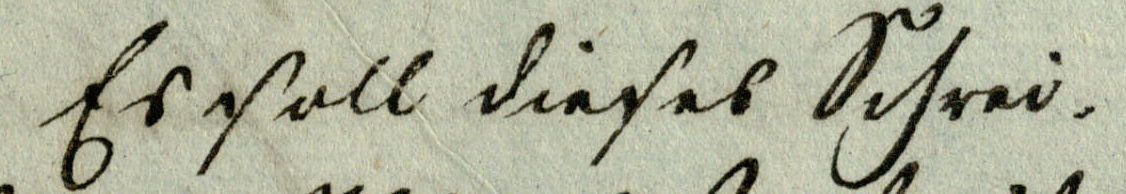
Es soll dieses Schrei¬
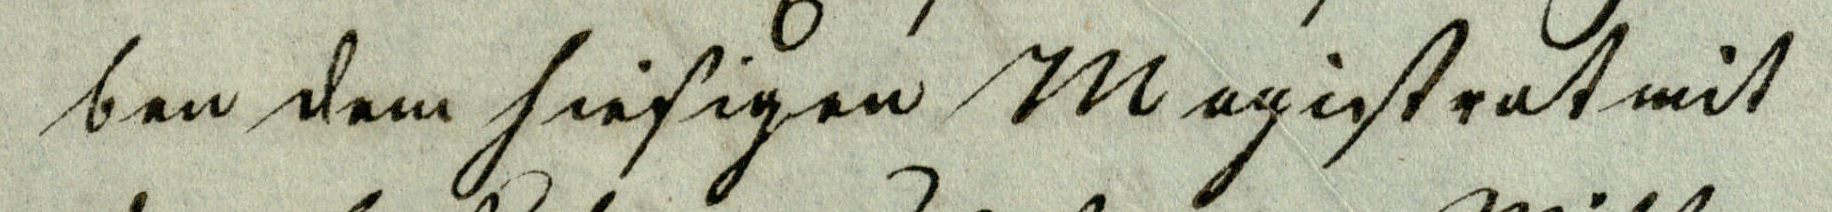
ben dem hiesigen Magistrat mit
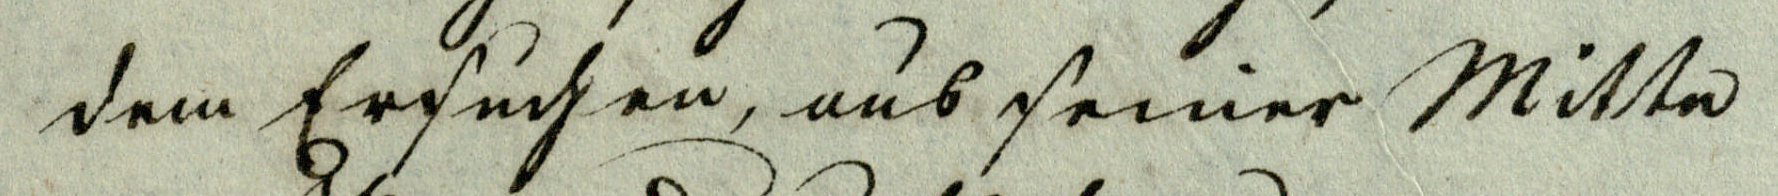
dem Ersuchen, aus seiner Mitte
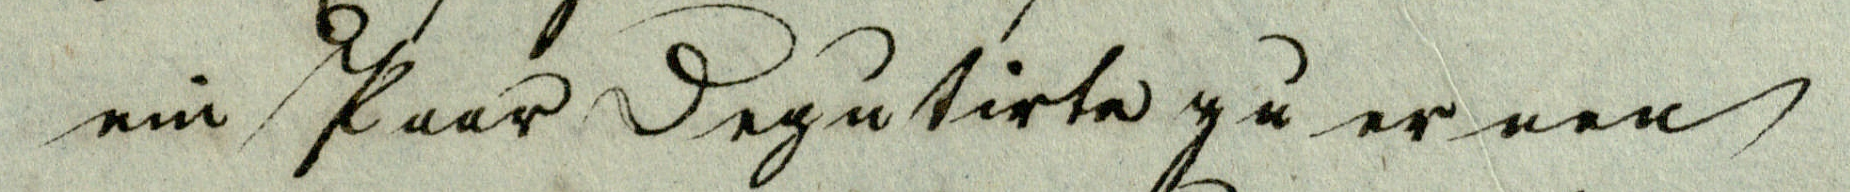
ein Paar Deputirte zu ernen¬
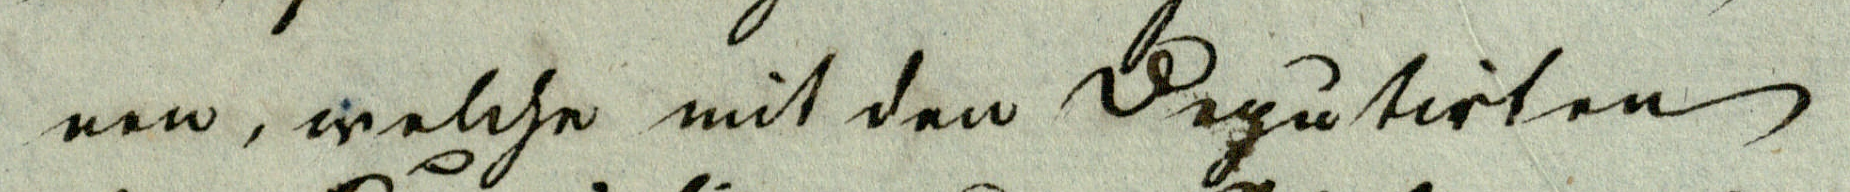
nen, welche mit den Deputirten
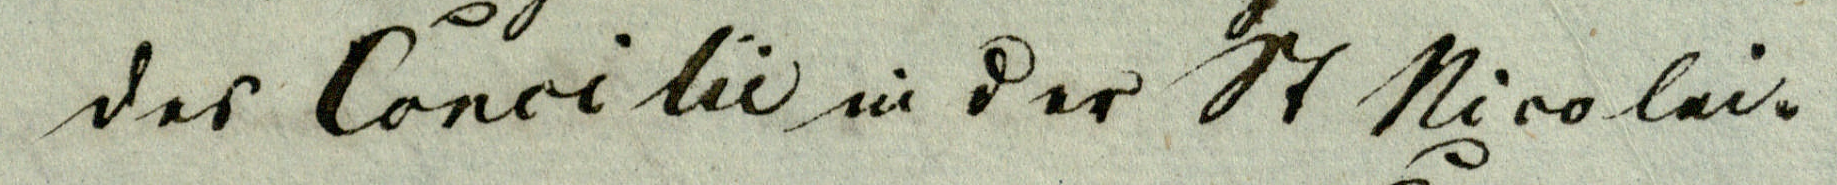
des Concilii in der St Nicolai¬
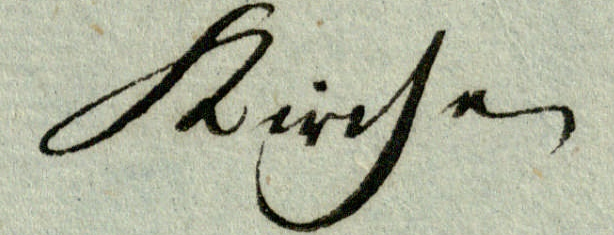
Kirche
